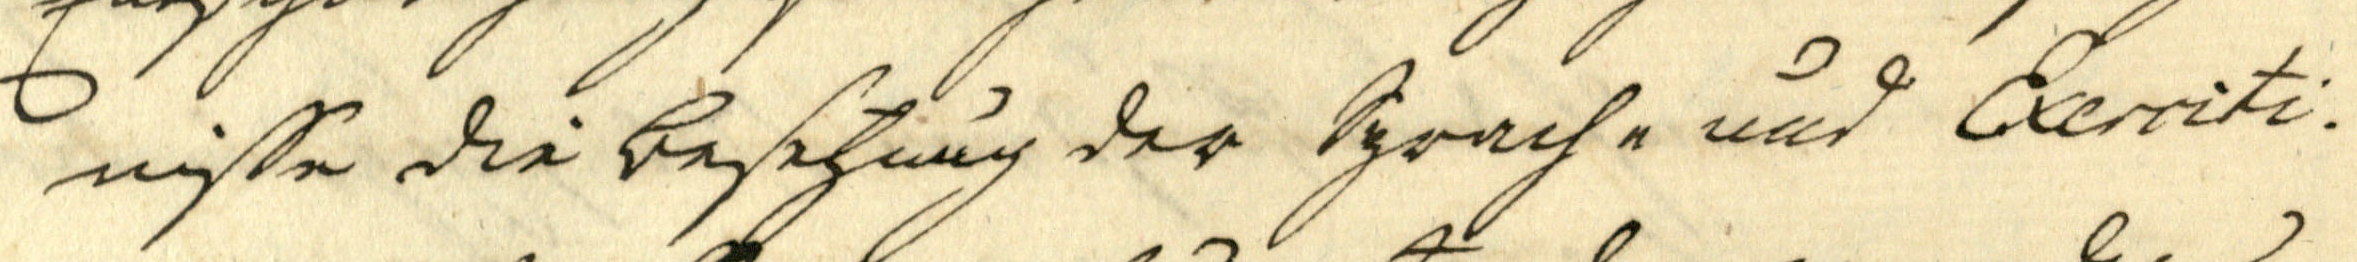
nisse die Besetzung der Sprach- und Exerciti¬
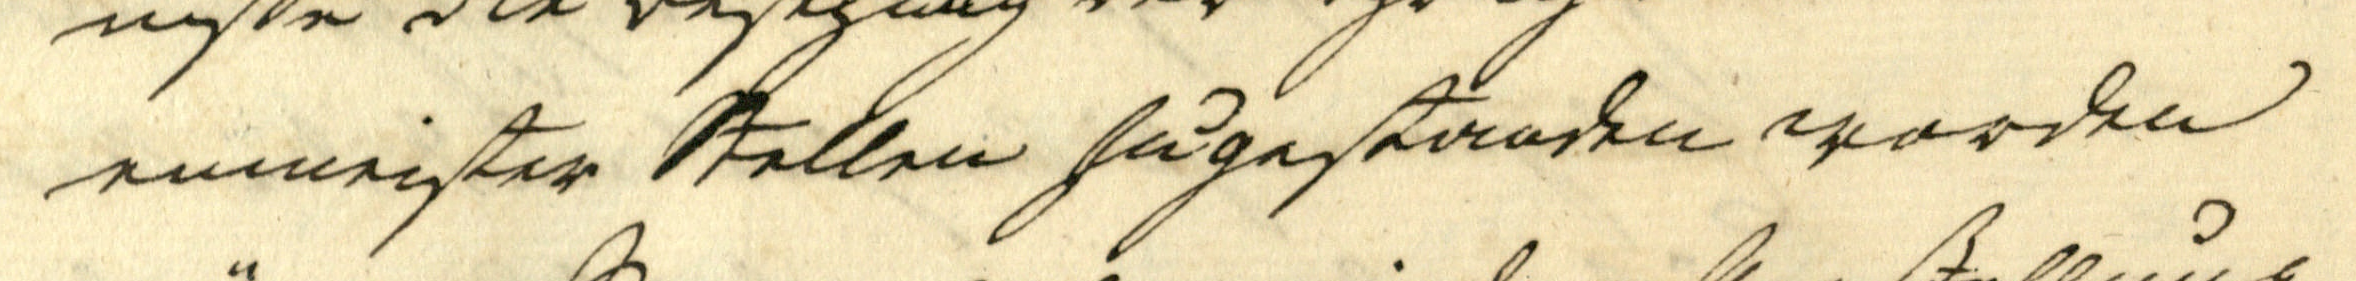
enmeister Stellen zugestanden worden
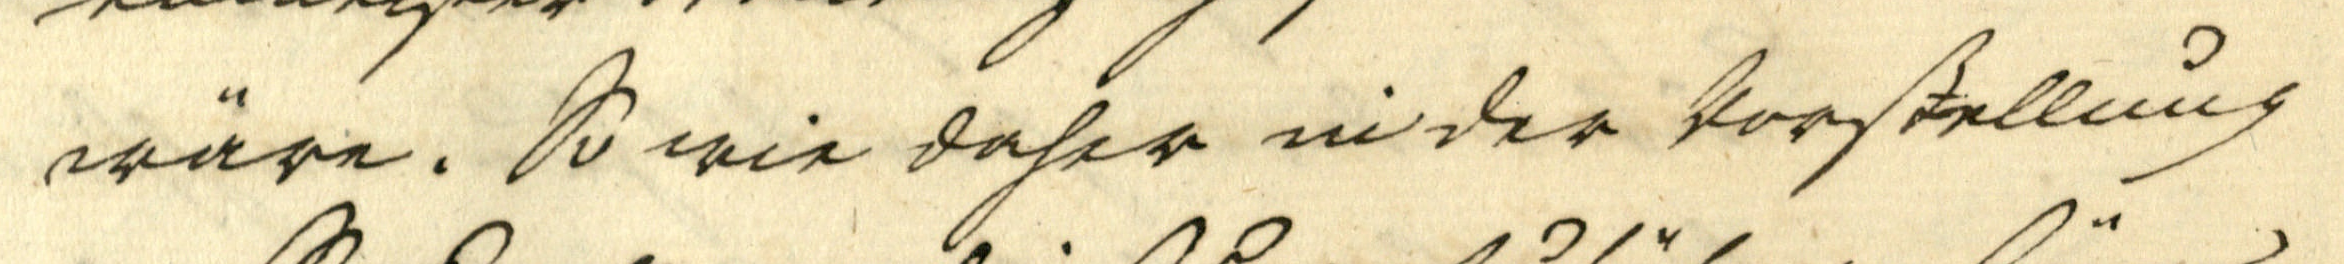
wäre. So wie daher in der Vorstellung
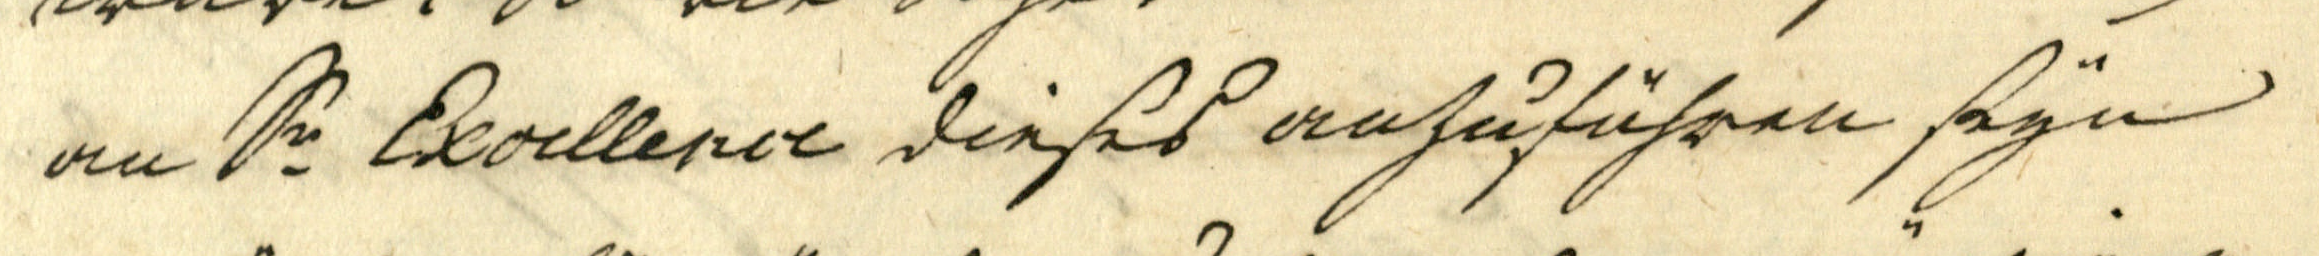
an Sr. Excellence dieses anzuführen seÿn
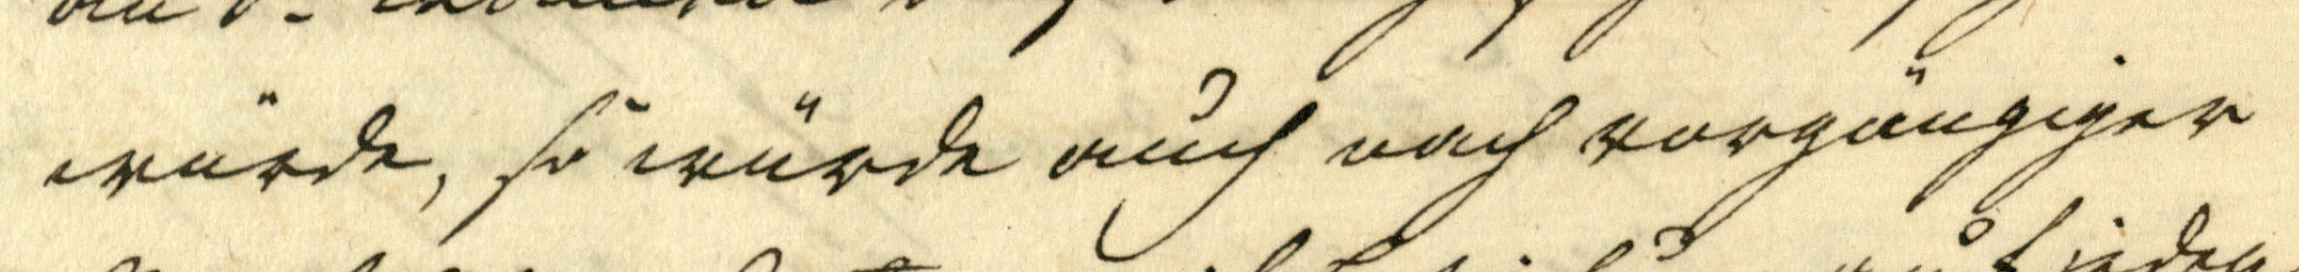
würde, so würde auch nach vorgängiger
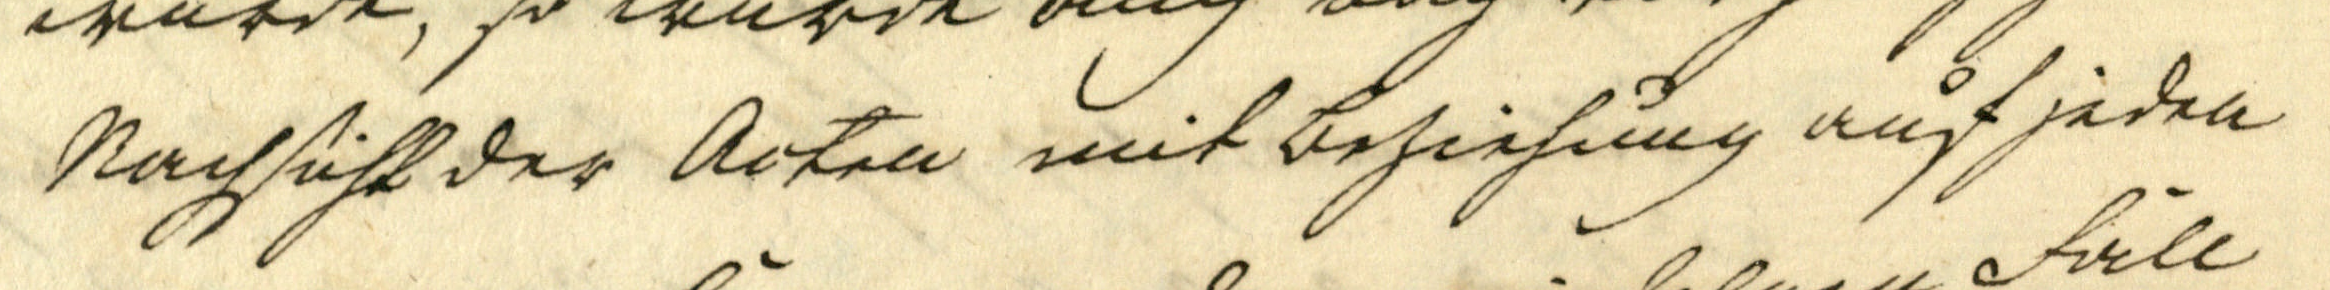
Nachsicht der Acten mit Beziehung auf jeden
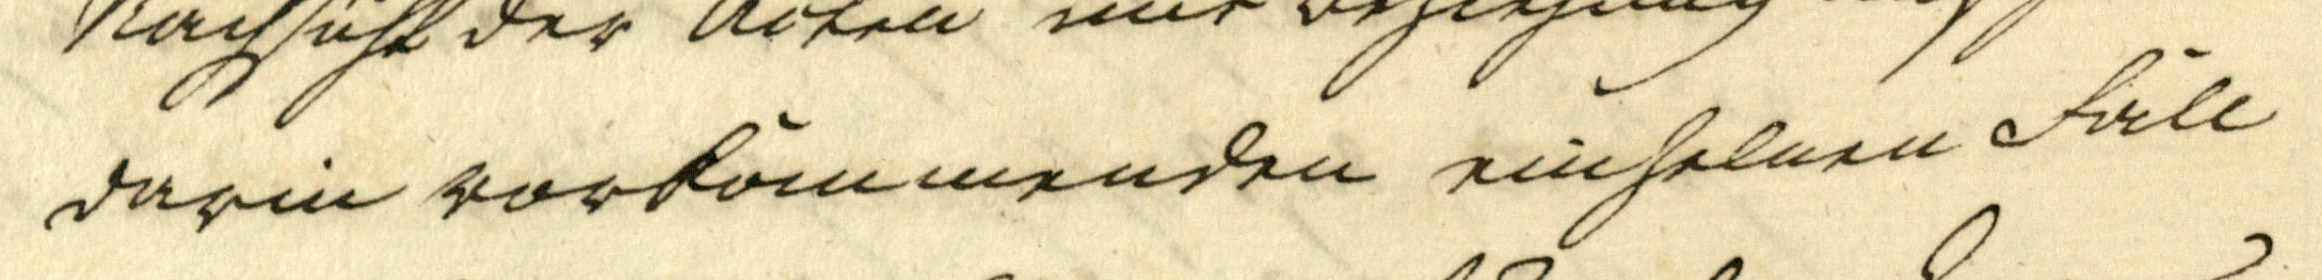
darin vorkommenden einzelnen Fall
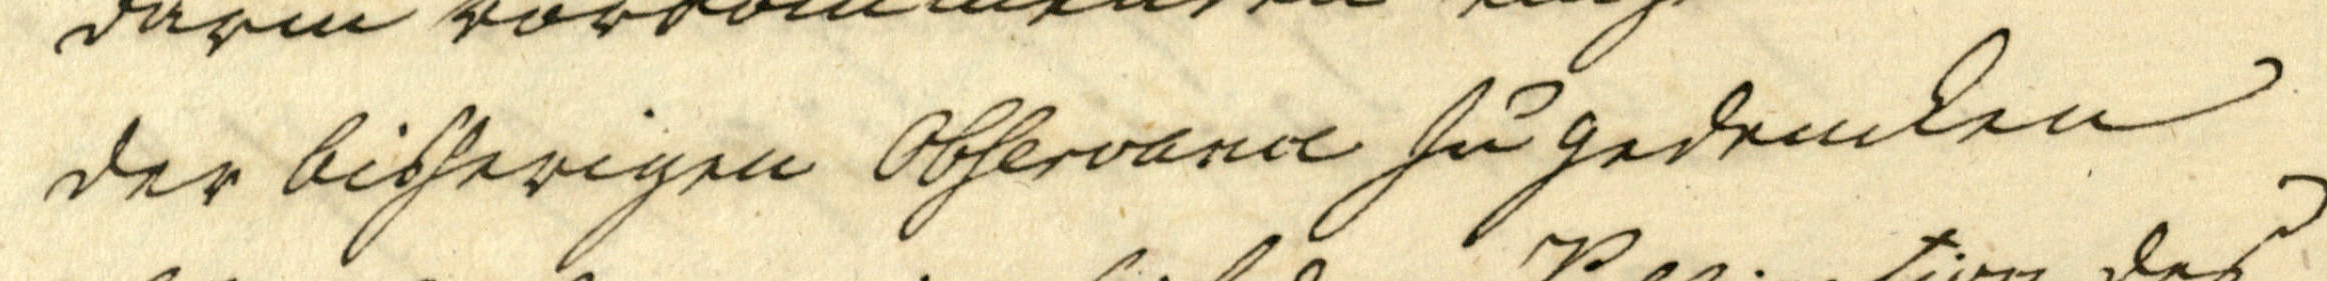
der bisherigen Observance zu gedencken
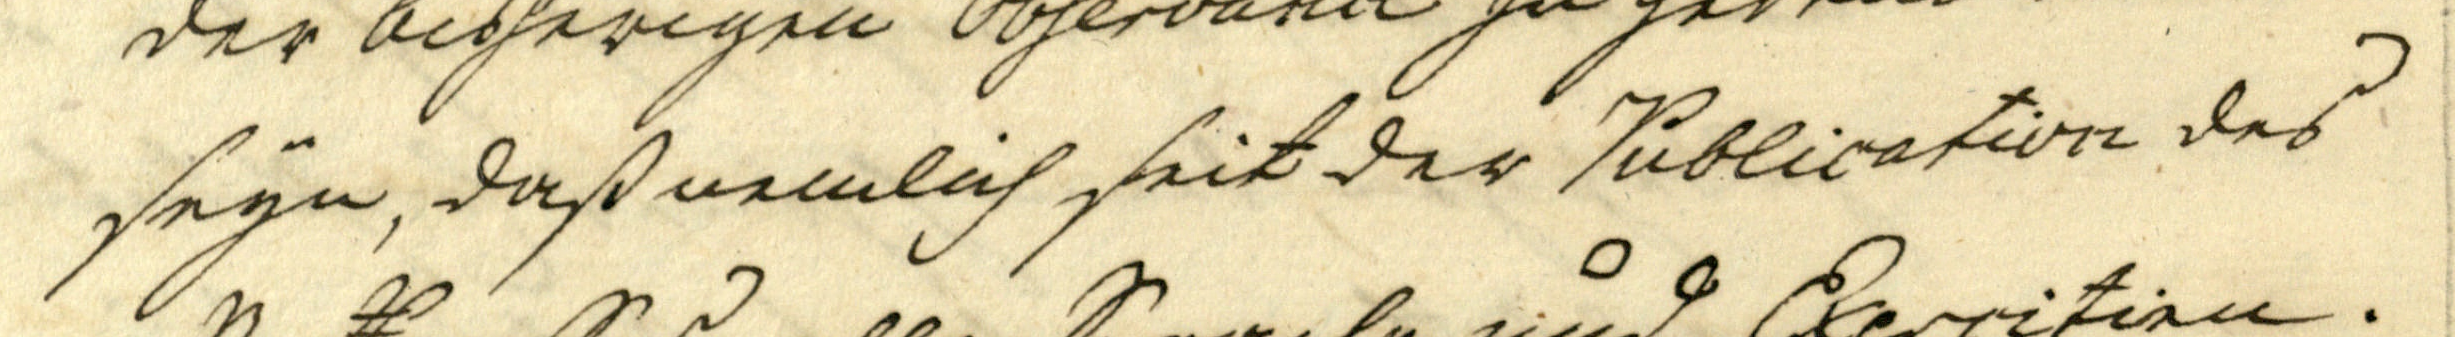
seÿn, daß nemlich seit der Publication des
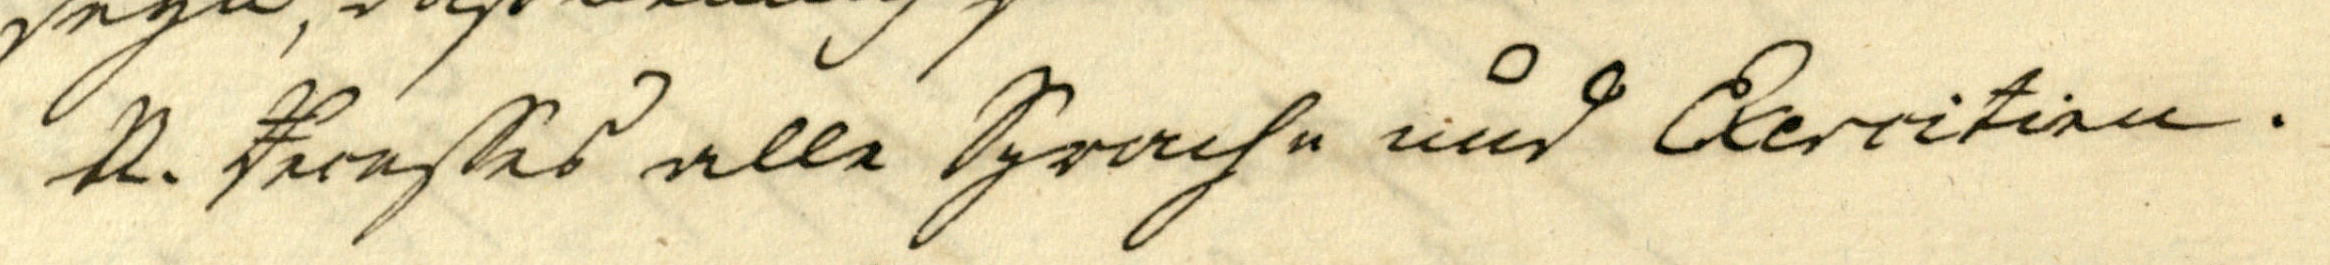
N. Recesses alle Sprach- und Exercitien¬
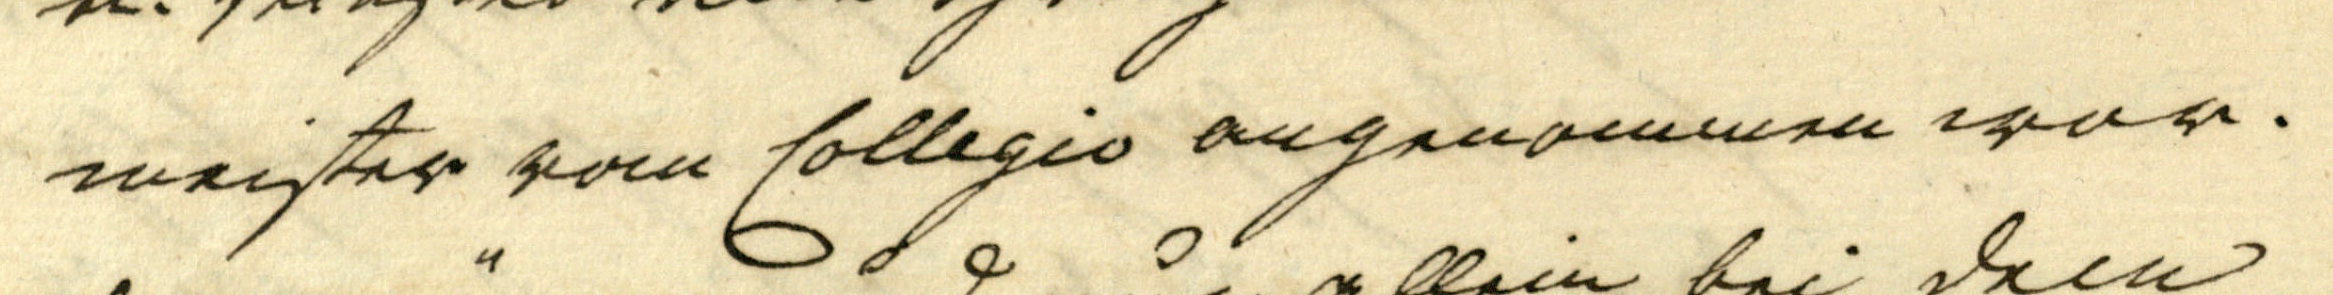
meister vom Collegio angenommen wor¬
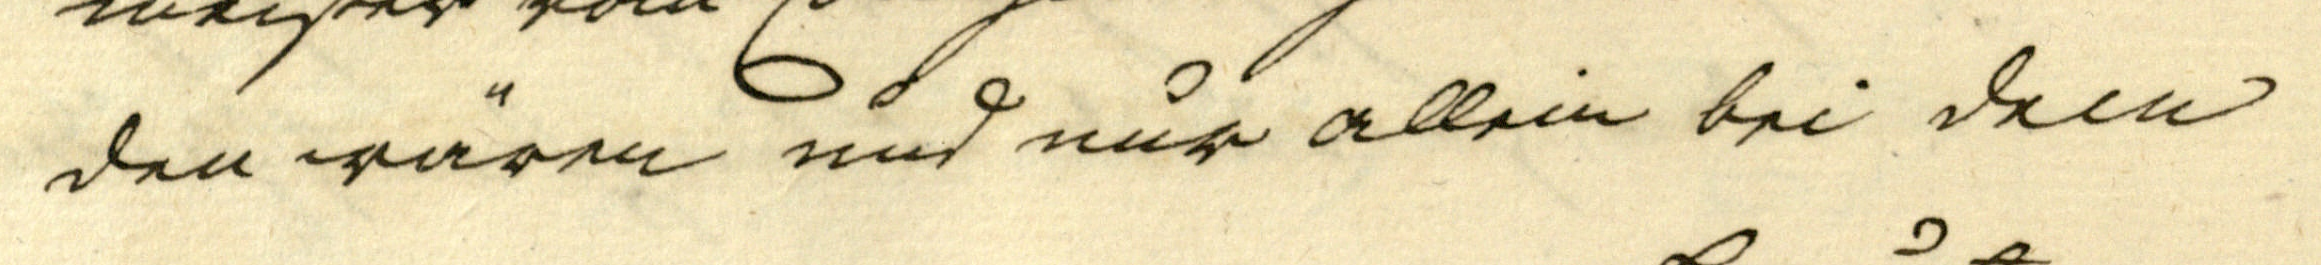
den wären und nur allein bei dem
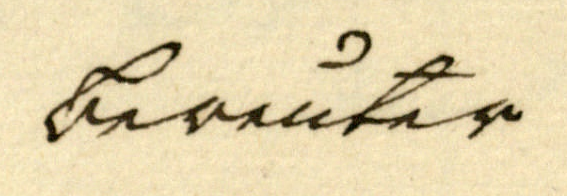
Bereuter
